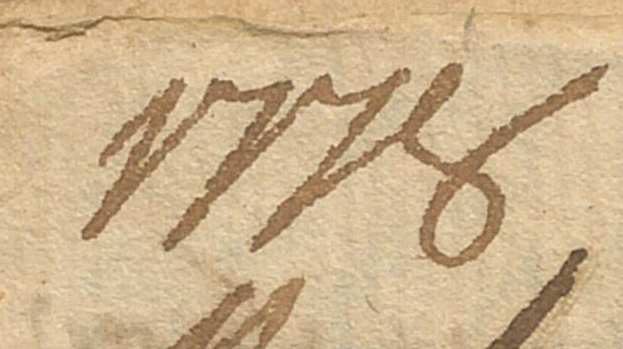1778
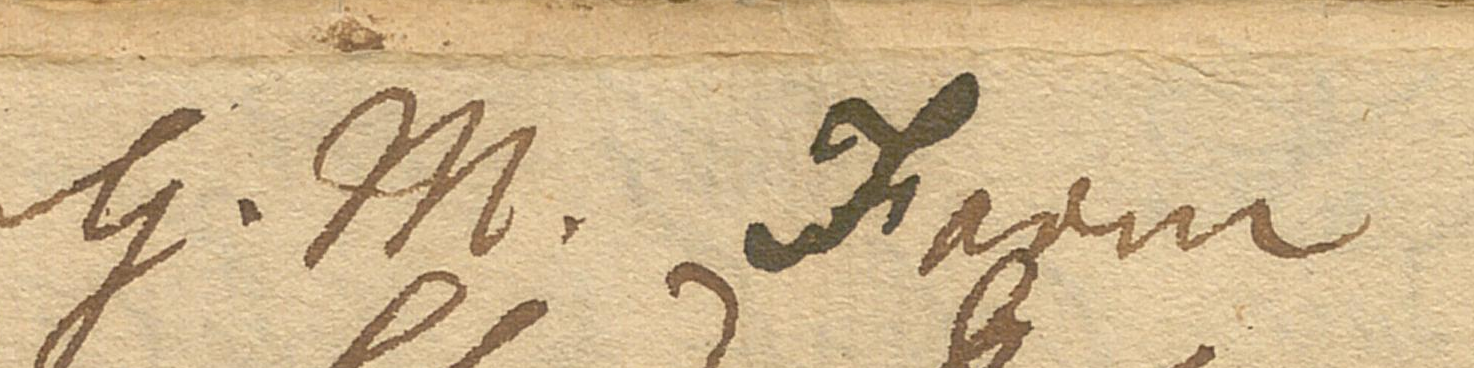G. M. Farm
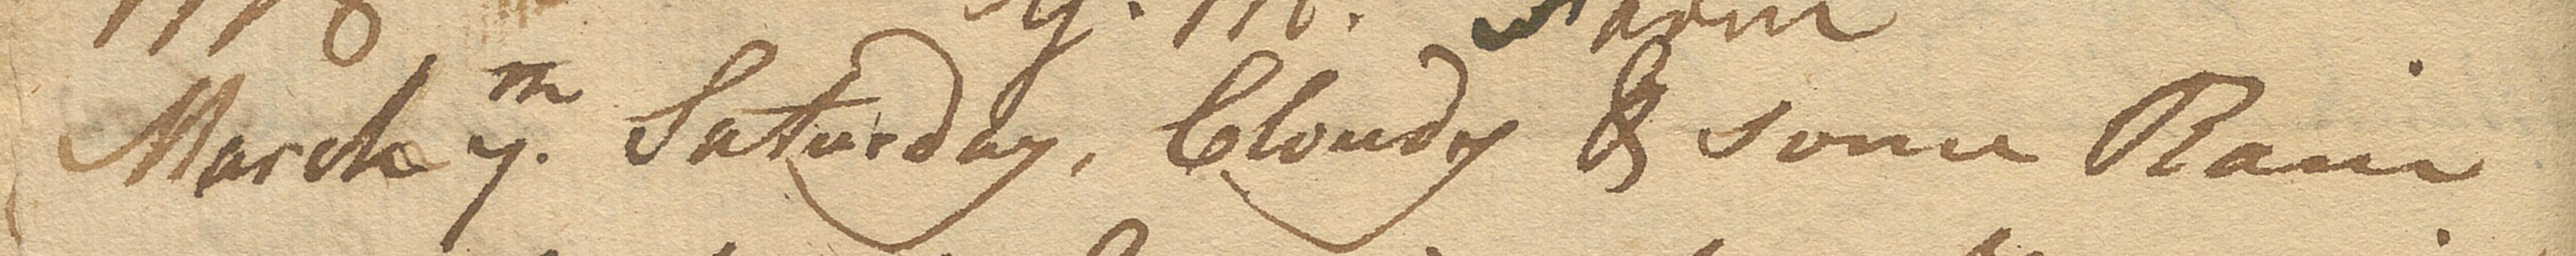March 7^th. Saturday. Cloudy & some Rain
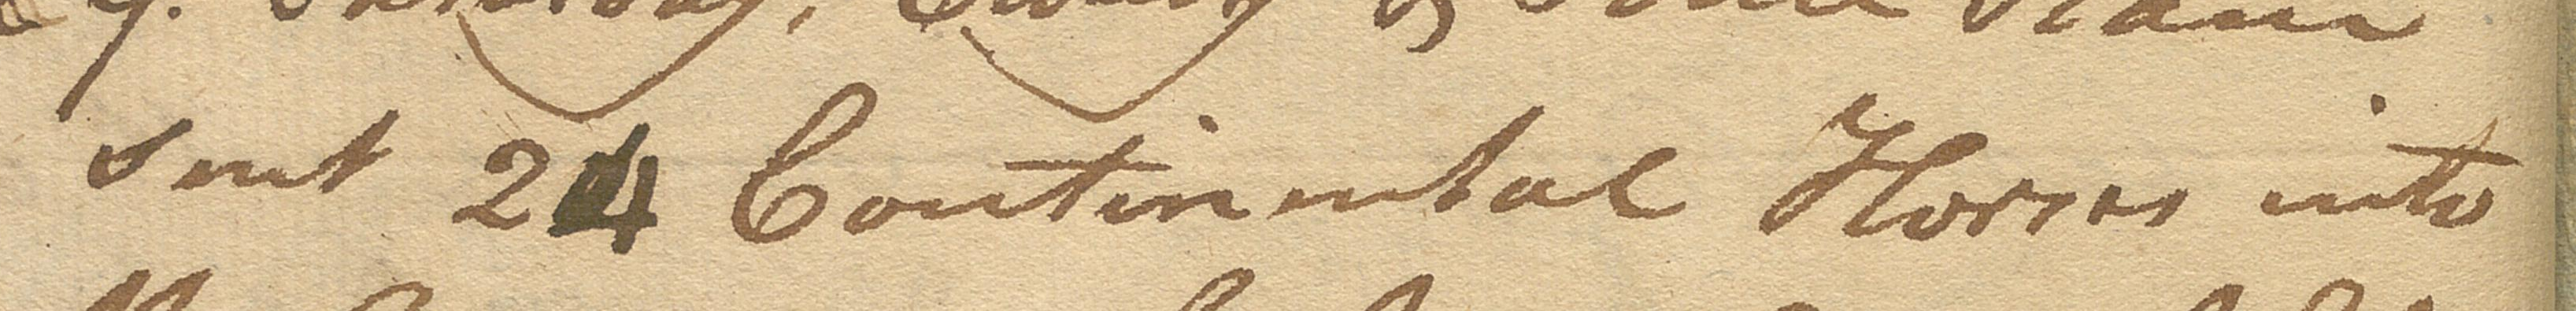sent 24 Continental Horses into
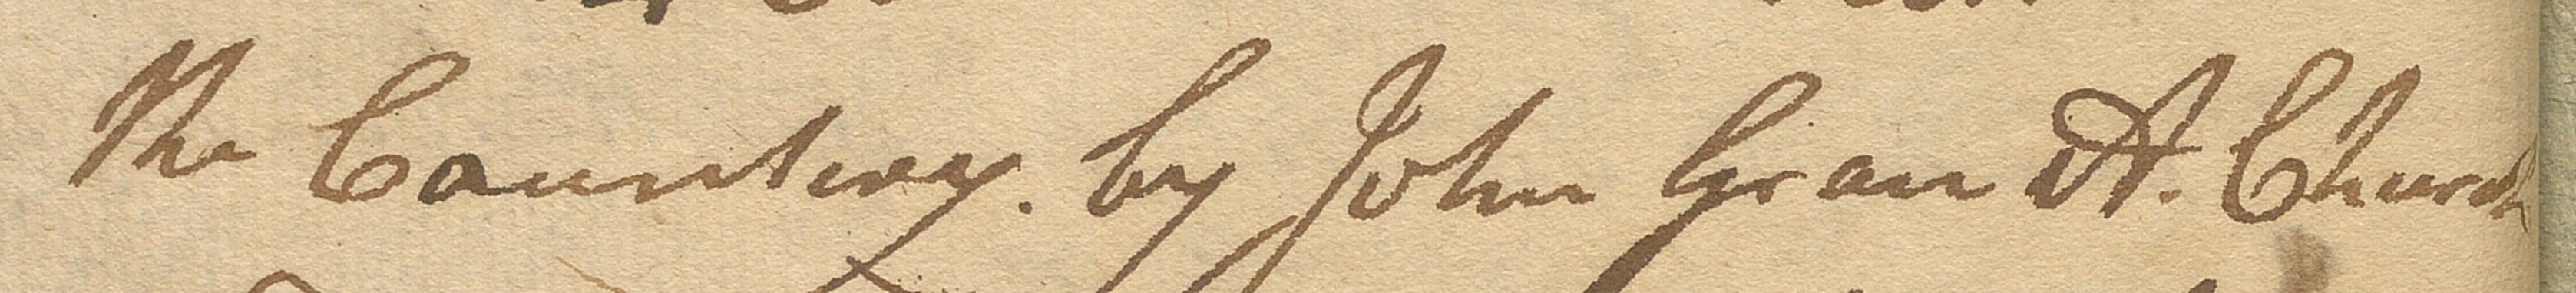the Cauntery by John Grau A. Church
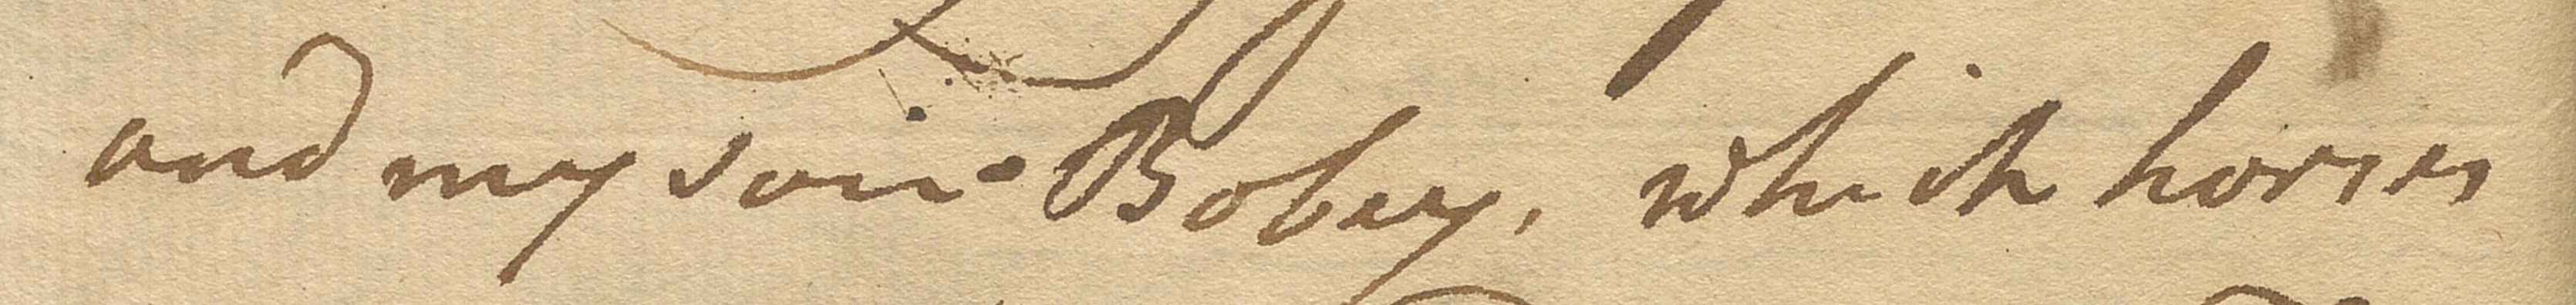and my son Bobey, which horses
